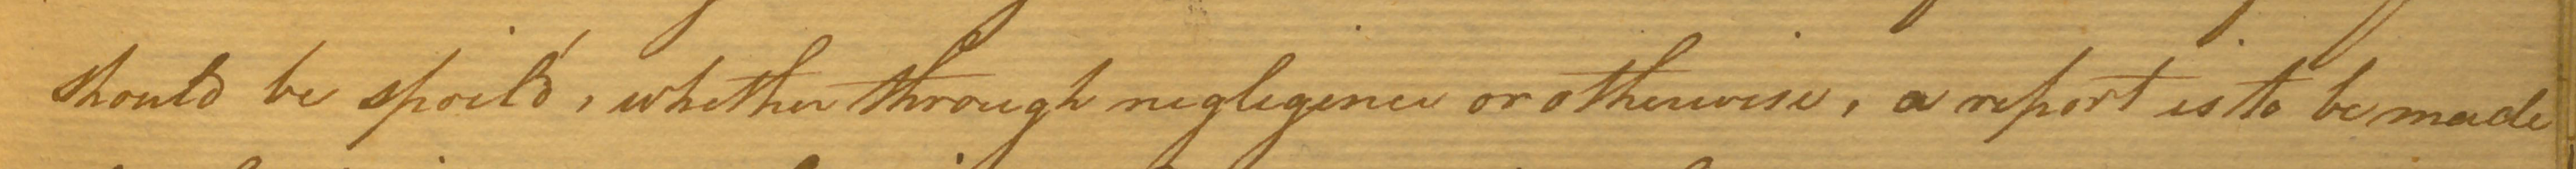should be spoil'd, whether through negligence or otherwise, a report is to be made
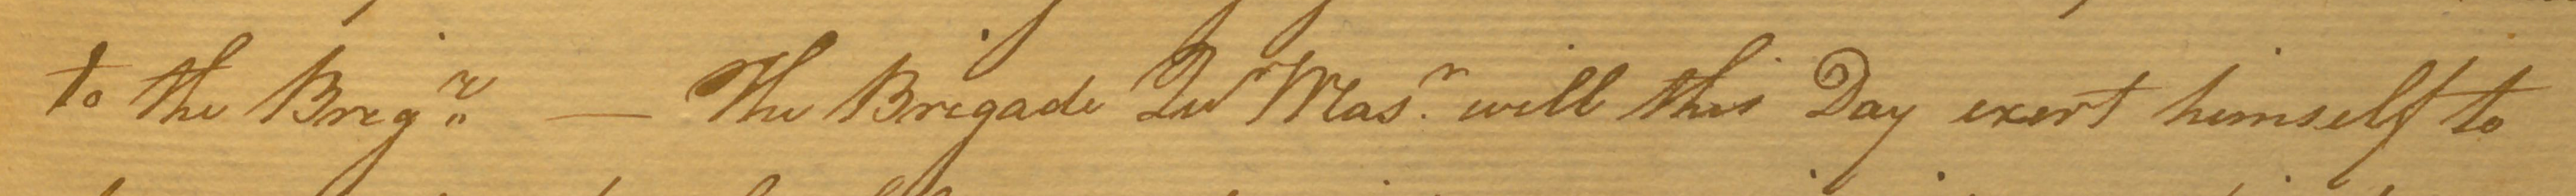to the Brig^r.- The Brigade Qu^r Mas^r. will this Day exert himself to
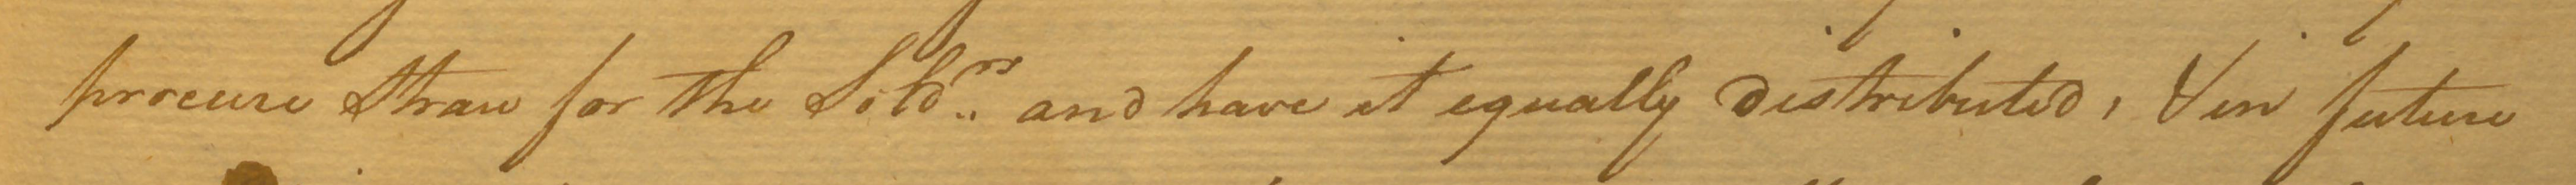procure Straw for the Sold^rs. and have it equally distributed, & in future
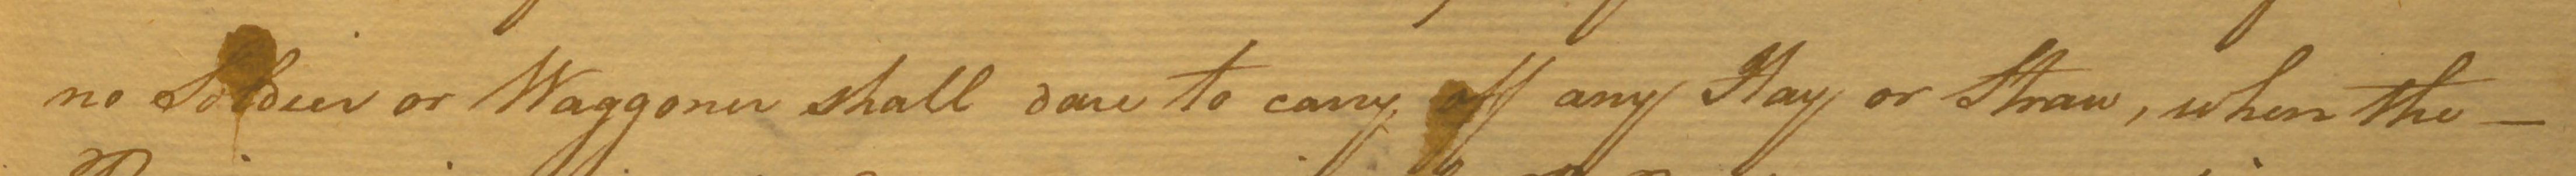no Soldier or Waggoner should dare to carry off any Hay or Straw, when the-
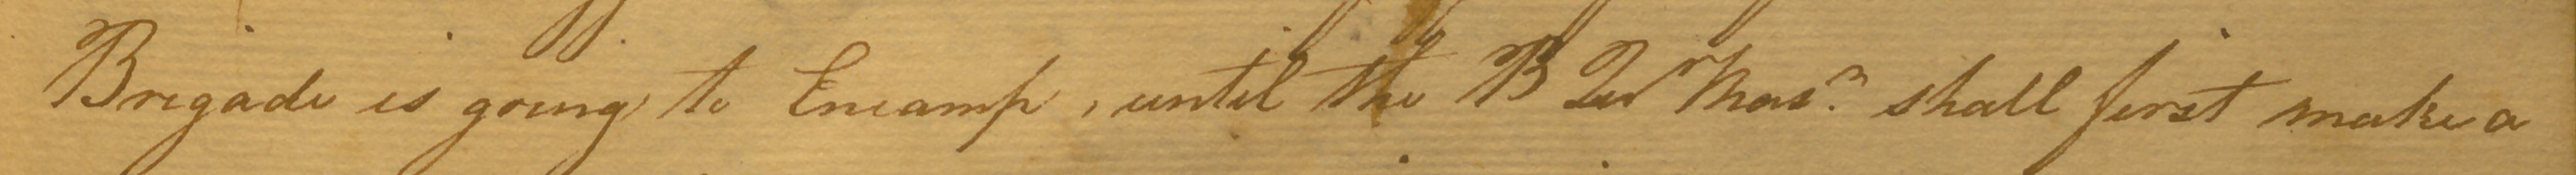Brigade is going to Encamp, until the B Qu^r. Mas^r. shall first make a
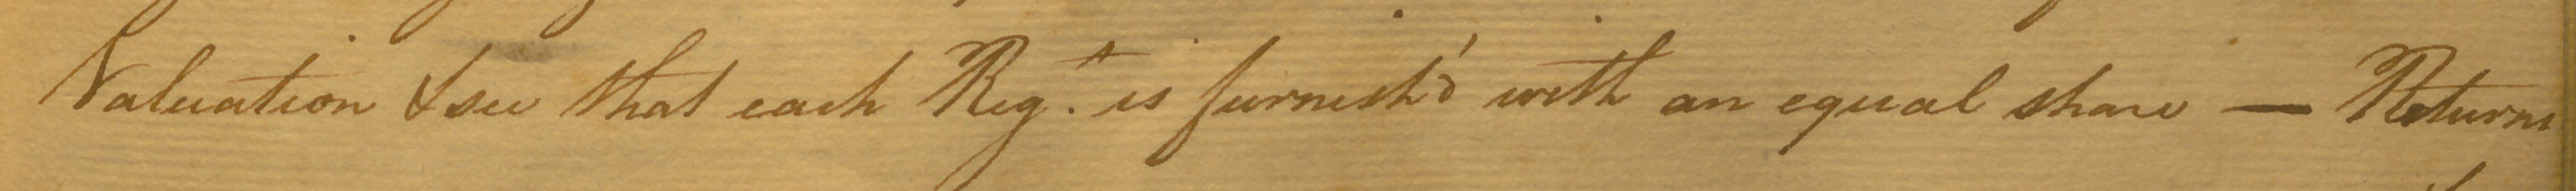Valuation & see that each Reg^t. is furnish'd with an equal share- Returns
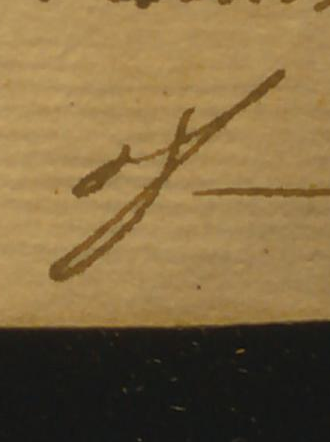of-
